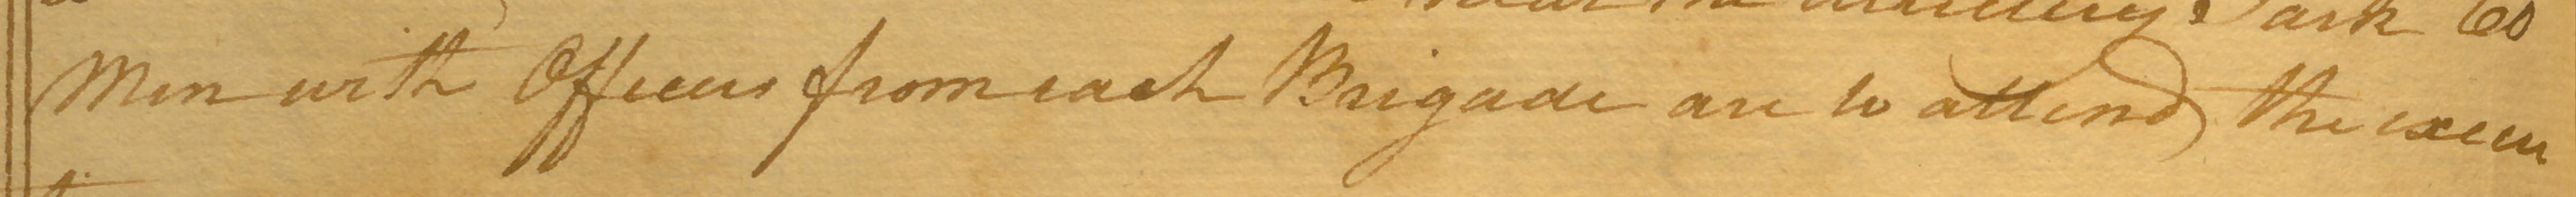Men with Officers from each Brigade are to attend the execu
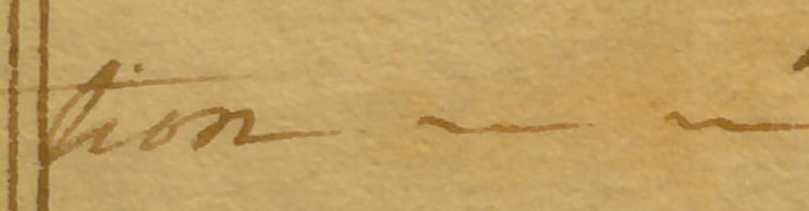tion- -
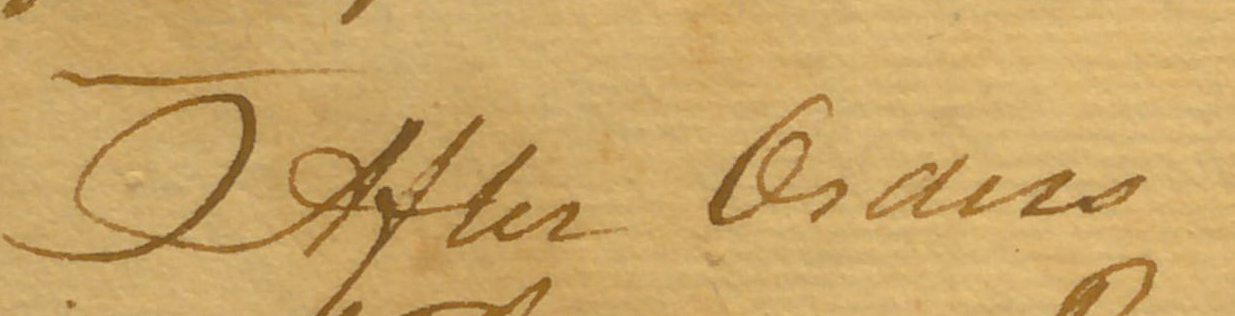After Orders
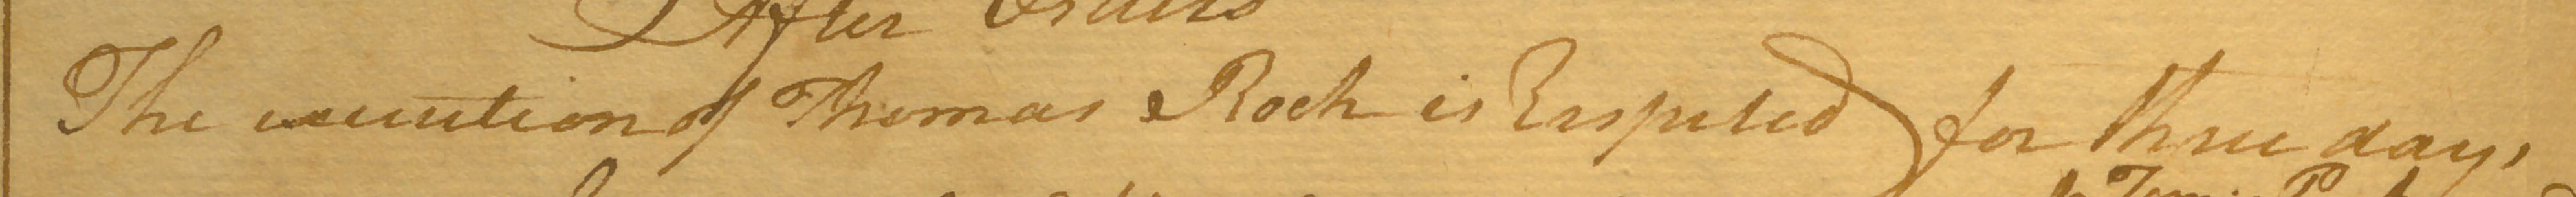The execution of Thomas Rock is Expected for three days
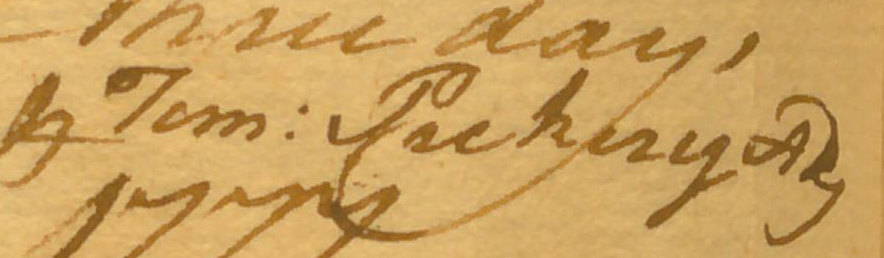Tim: Pickering AG
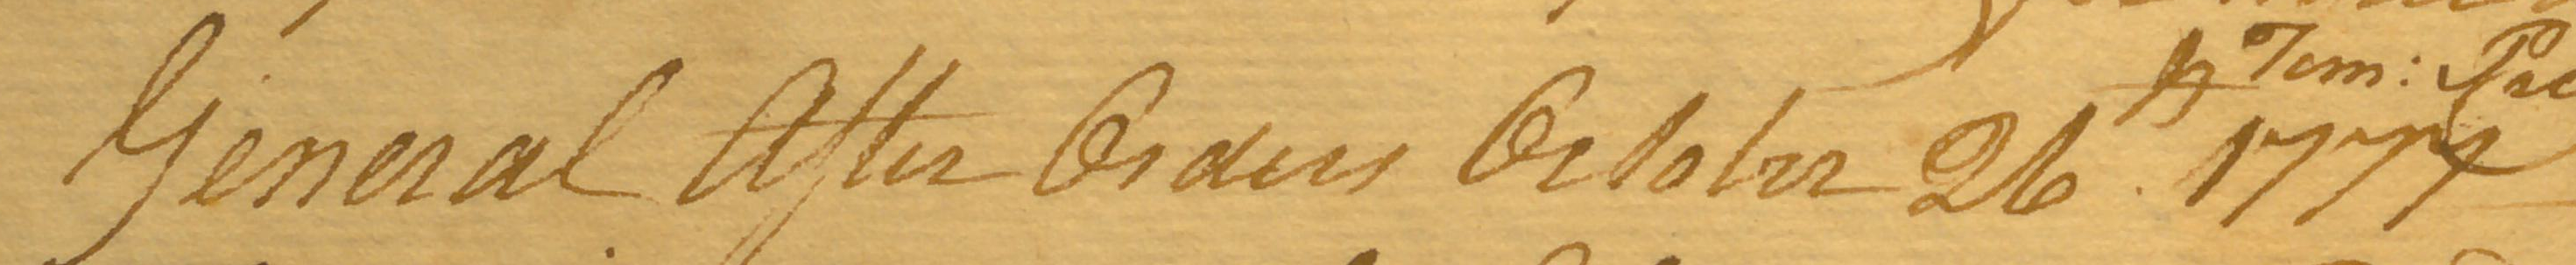General After Orders October 26^th 1777
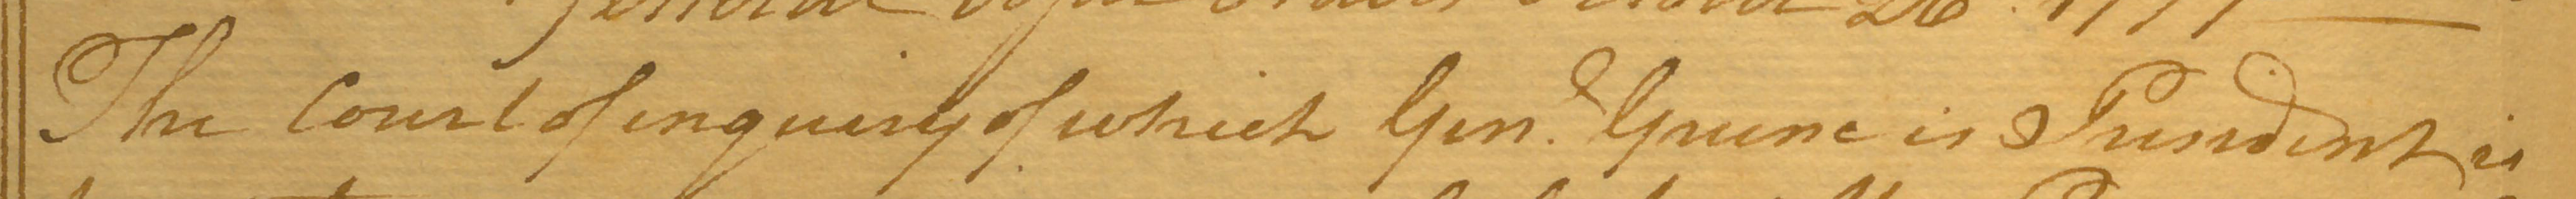The Court of inquiry of which Gen^l. Greene is President is
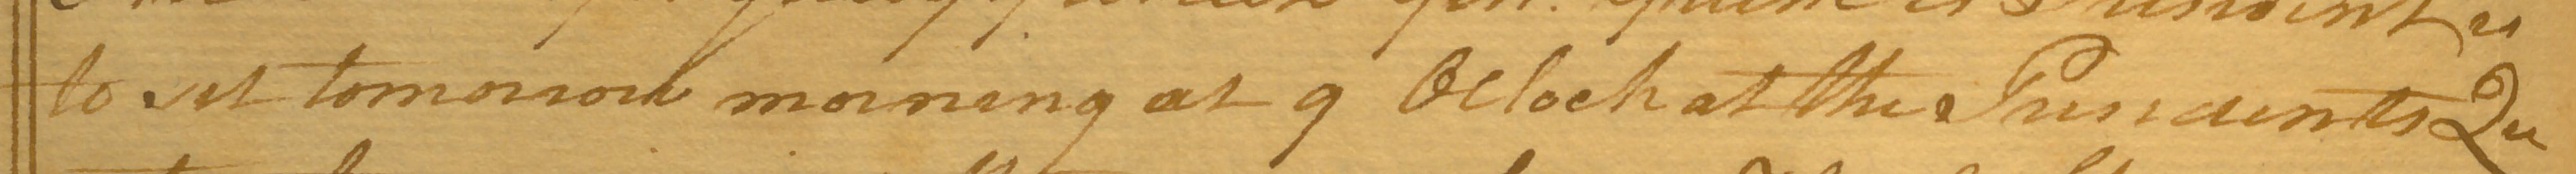to set tomorrow morning at 9 OClock at the Presidents Qu
